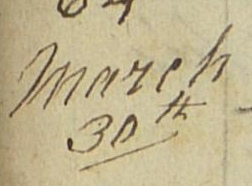March
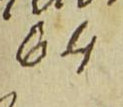64
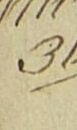30^th
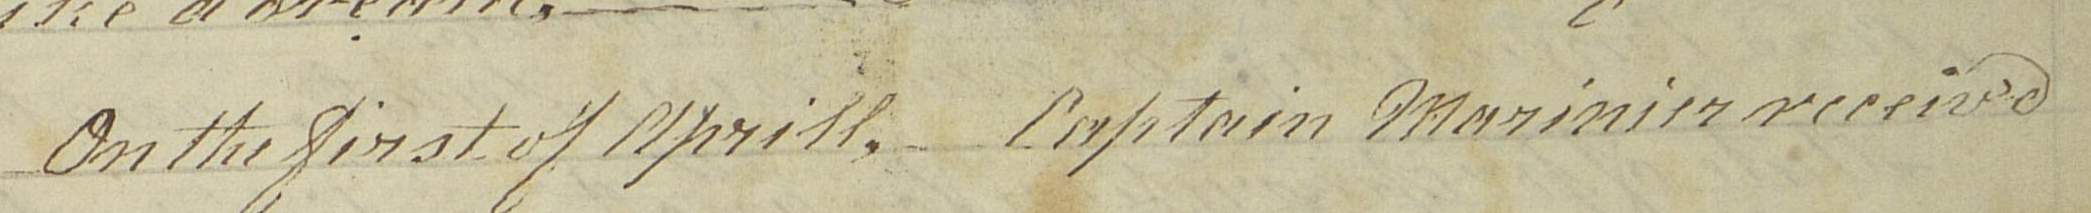On the first of Aprill, Captain Marinier receiv'd
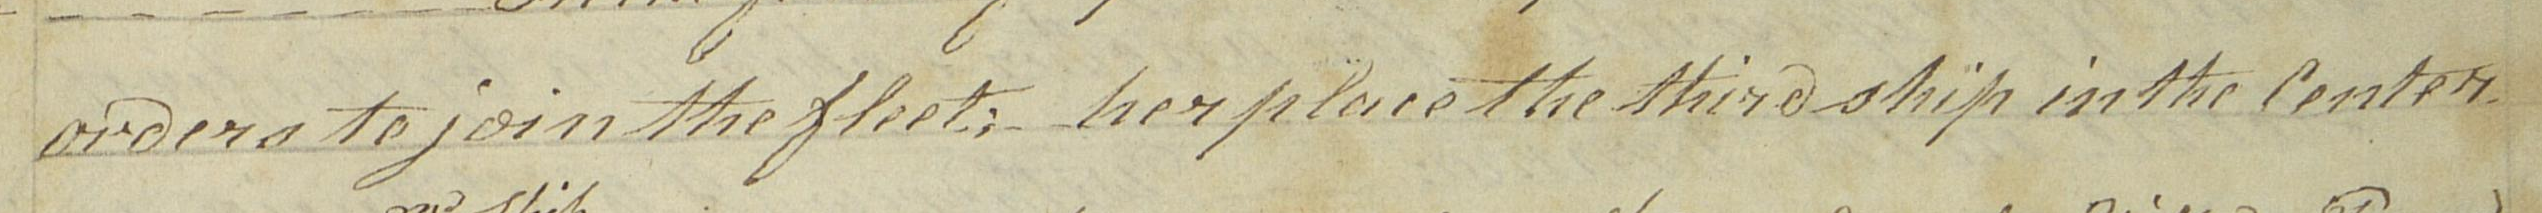orders to join the fleet; her place the third ship in the Center
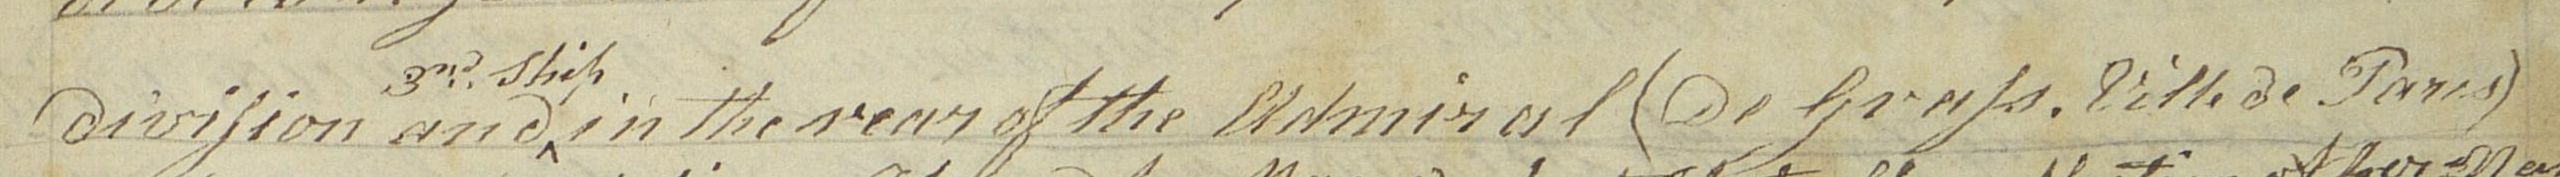division and ^ in the rear of the Admiral (De Grass. Ville de Paris)
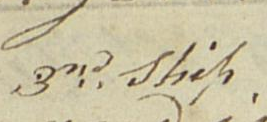3^rd Ship
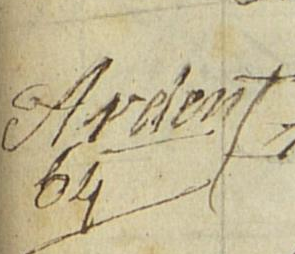Ardent
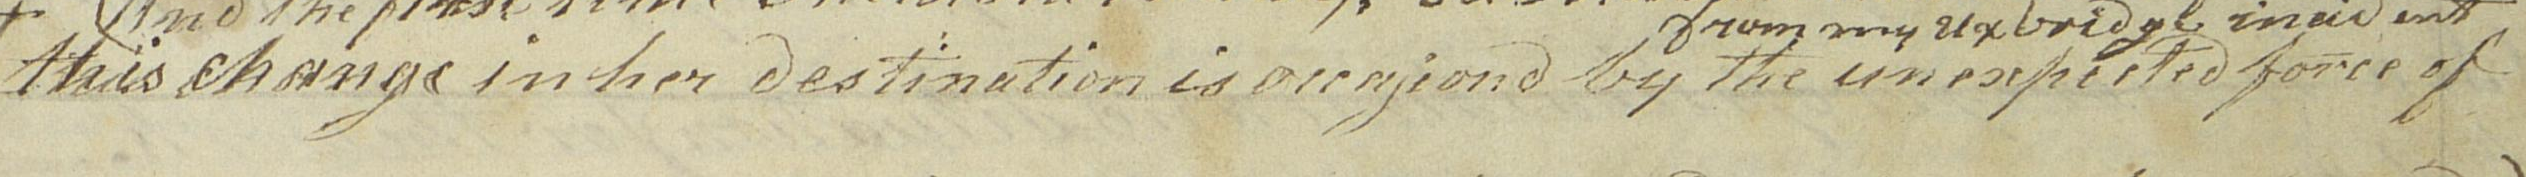this change in her destination is occasiond by the unexpected force of
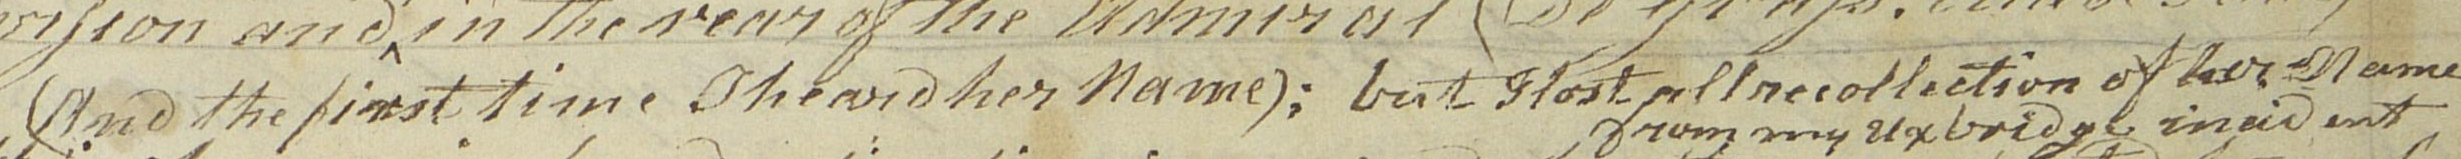(And the first time I heard her Name); but I lost all recollection of her Name
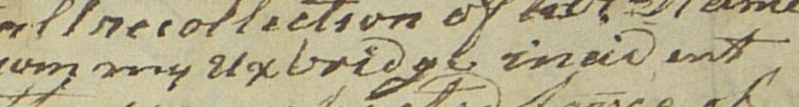from my Uxbridge incident
